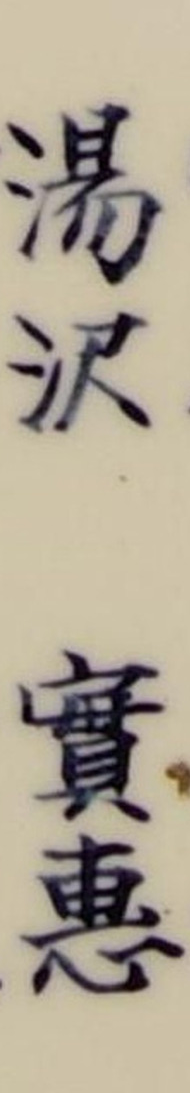湯沢實恵
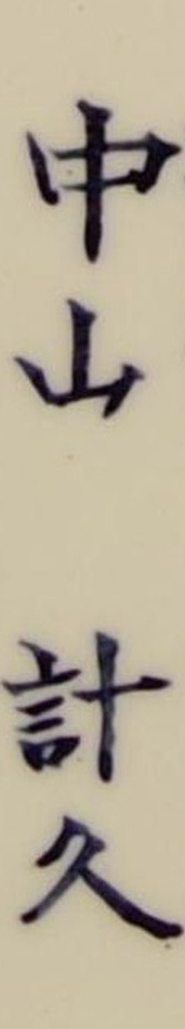中山計久
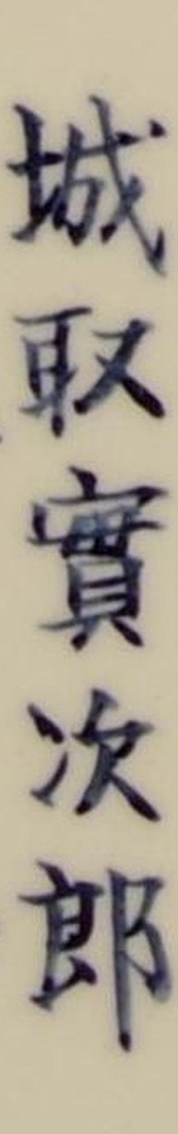城取實次郎
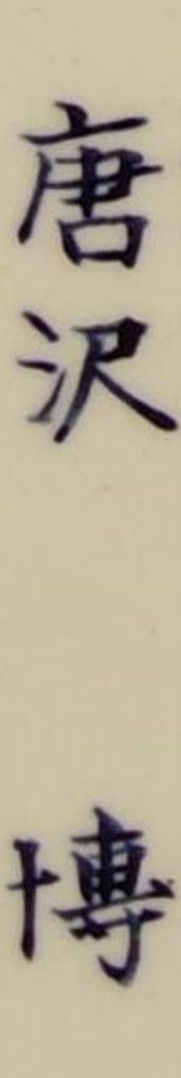唐沢伝
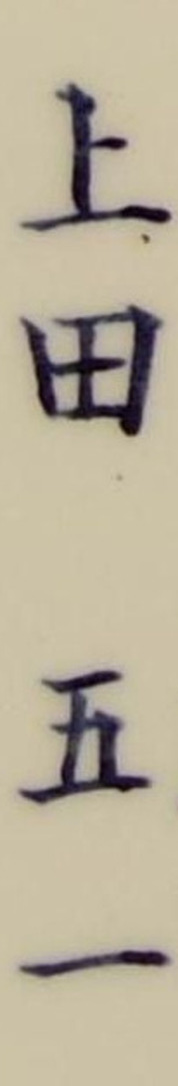上田五一
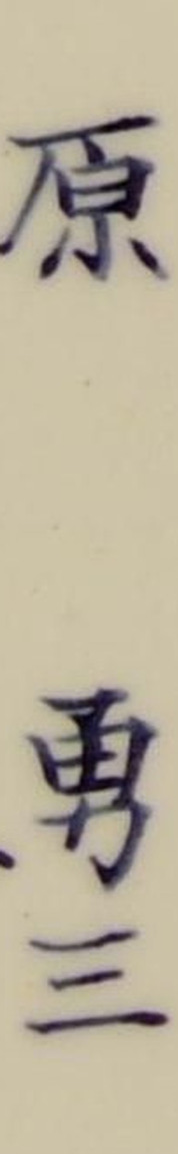原勇三
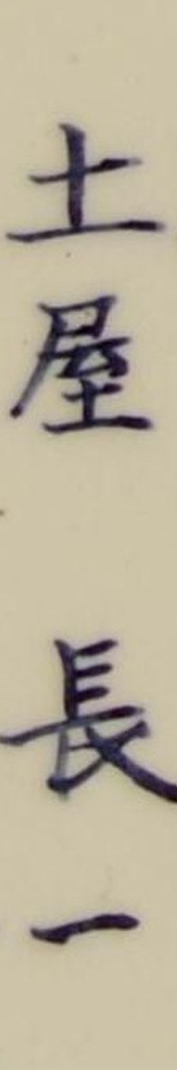土屋長一
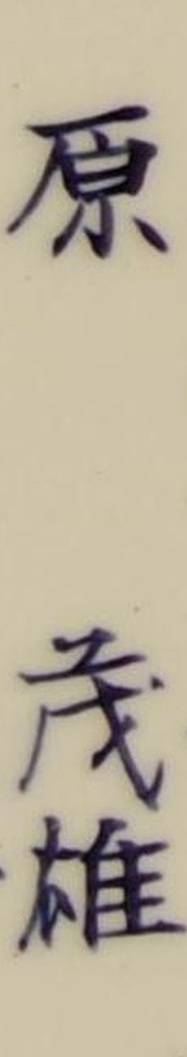原茂雄
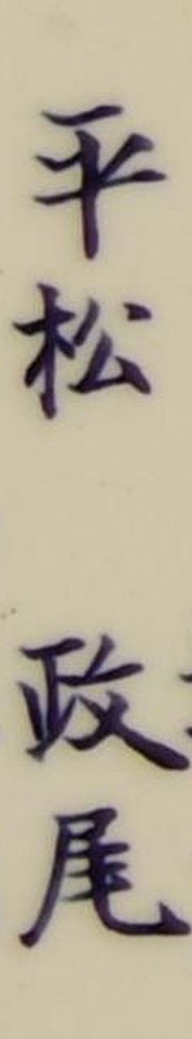平松政尾
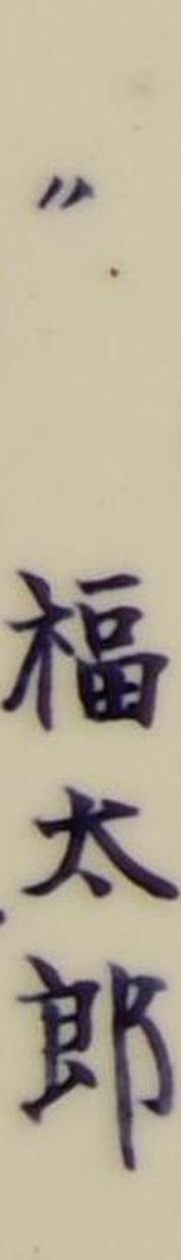福太郎
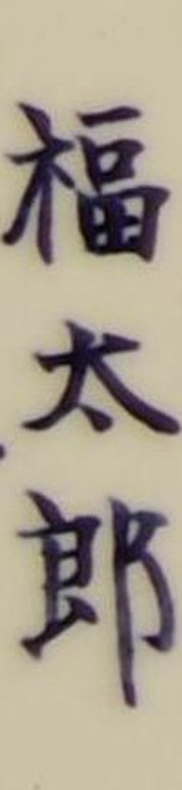福太郎
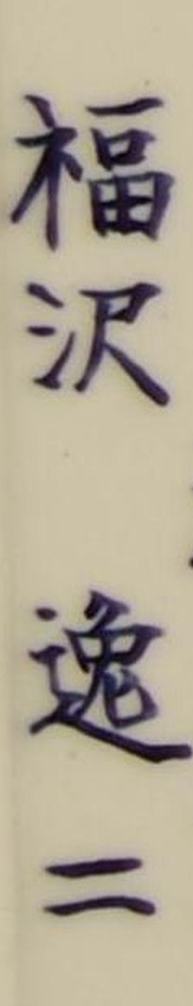福沢逸二

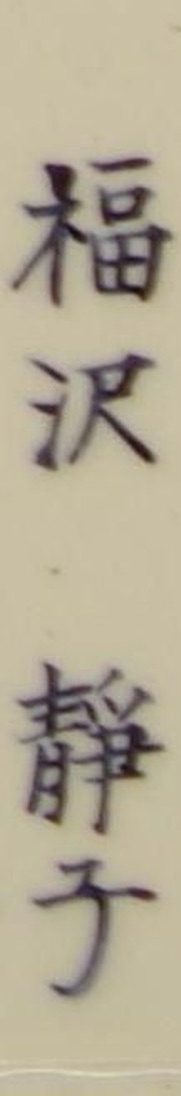福沢静子
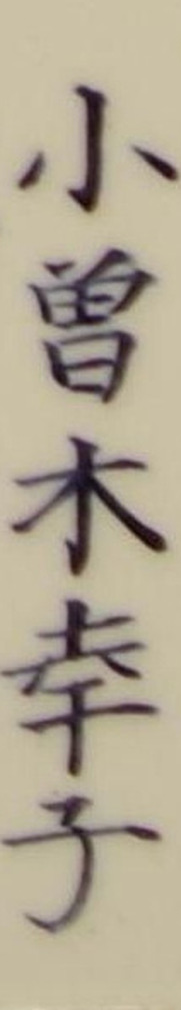小曽木李子
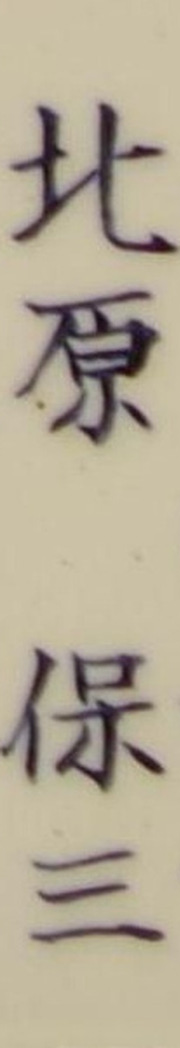北原保三
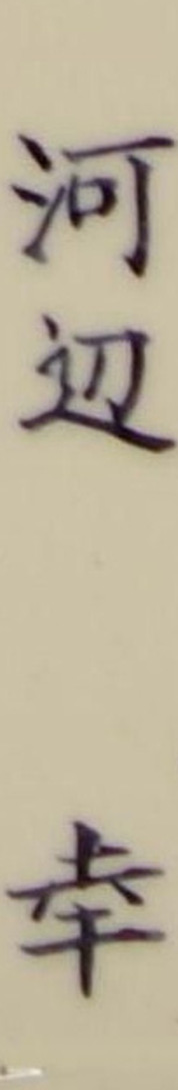河辺幸
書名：E~L
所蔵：高野山金剛峯寺
